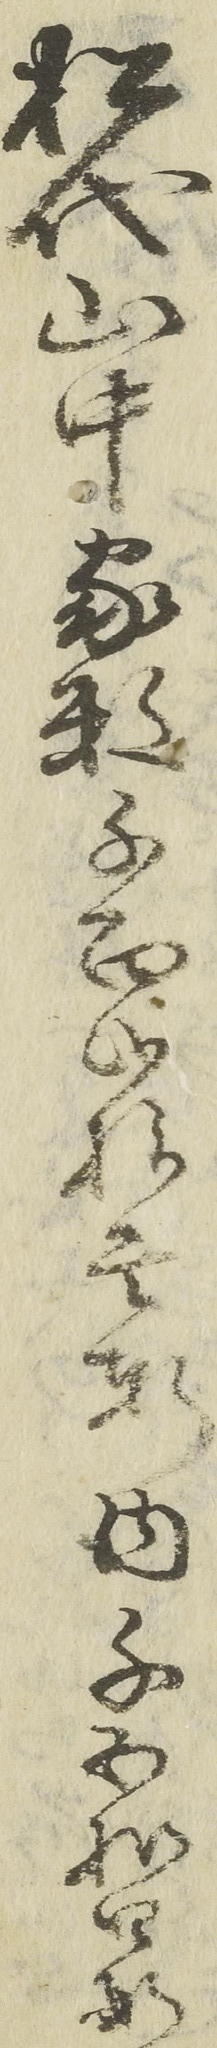松代山中家数千百弐拾壱軒内千五拾四軒
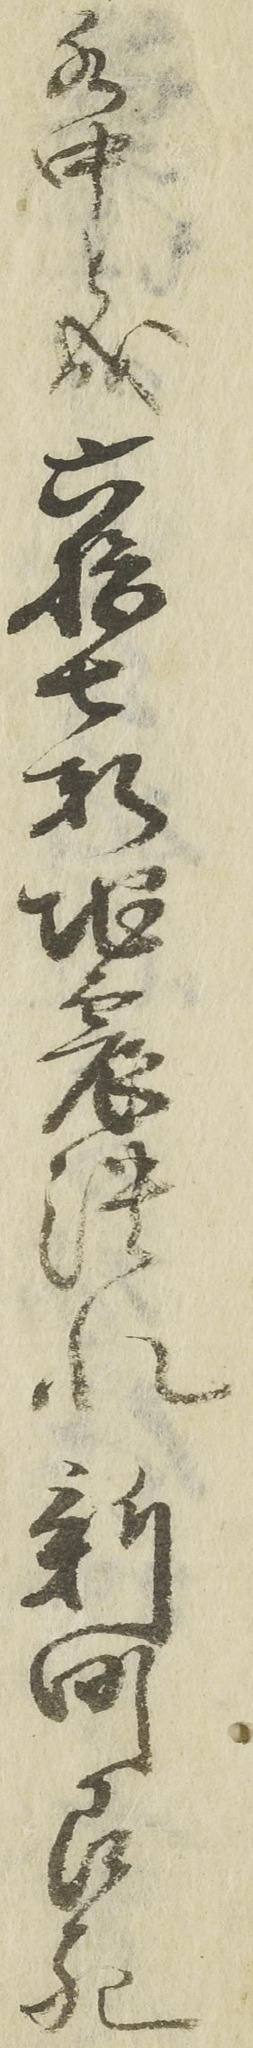水中と成六拾七軒地震潰れ新町即死
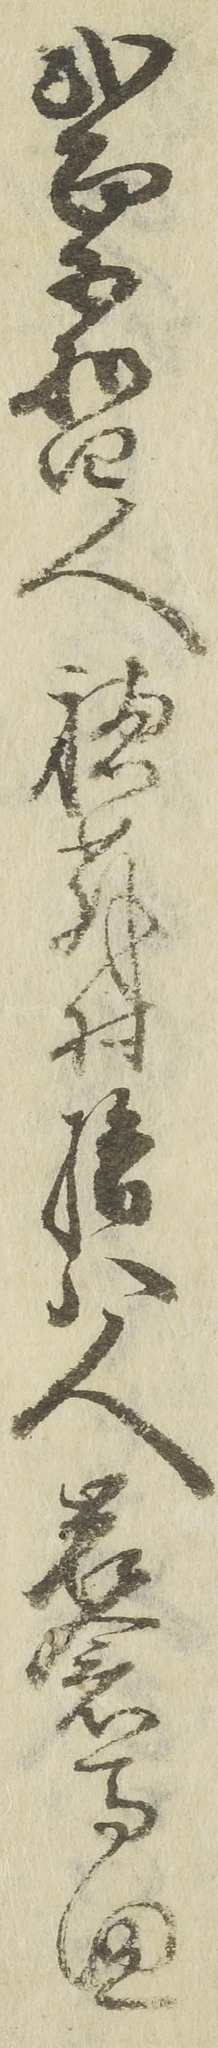弐百五拾四人穂刈村拾八人岩倉寺廻
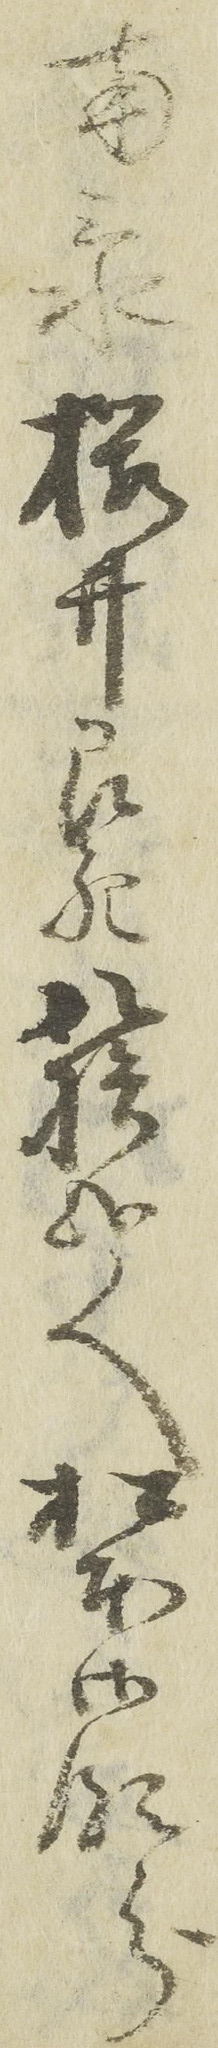南三水桜井即死八拾弐人松本御領分
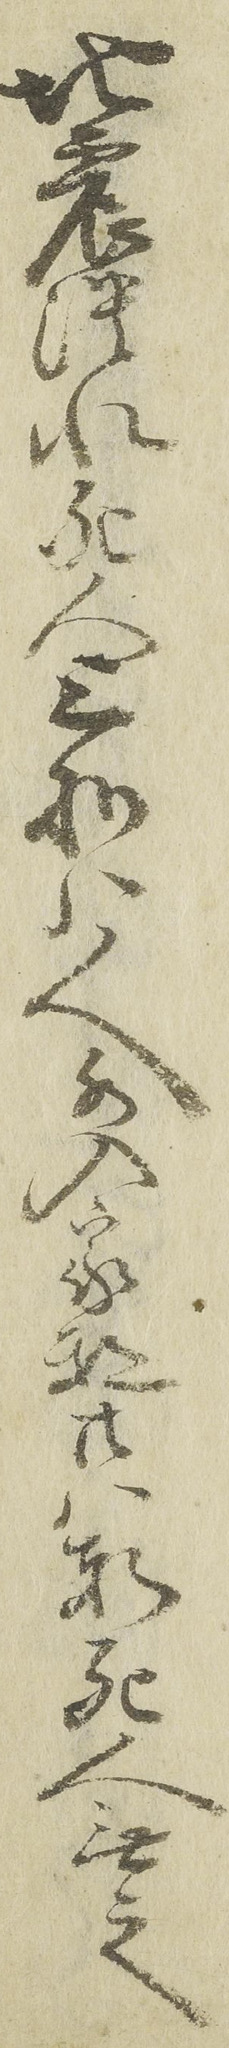地震潰れ死人三拾八人水入家数廿八軒死人無之

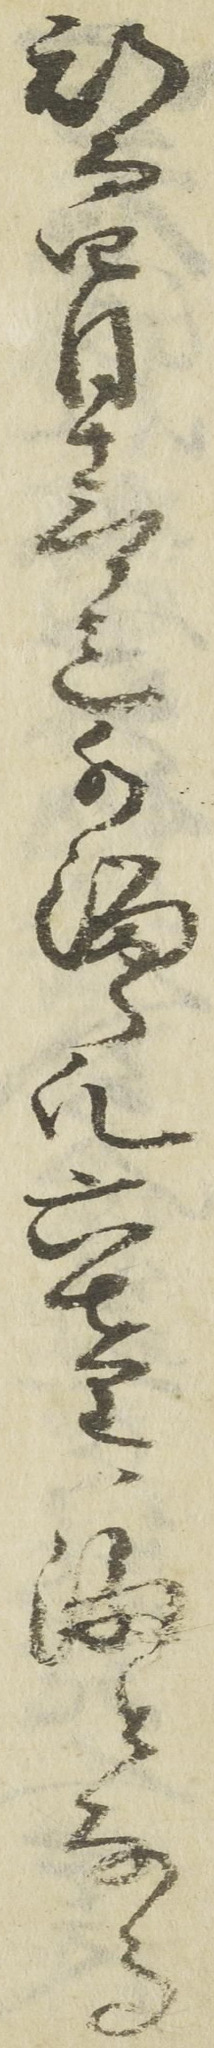都而四月十三日迄水溜り凡六七里ノ渦となる
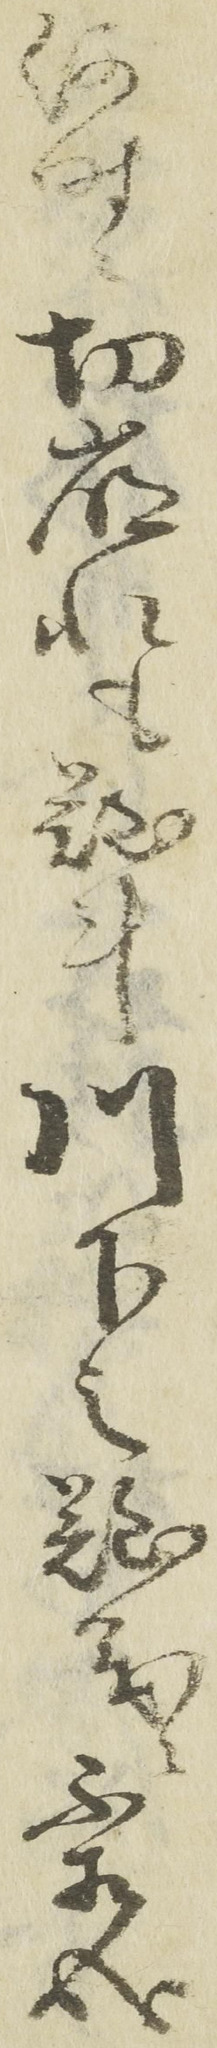何時ニ切崩れも難斗川下の難義ニ不相成
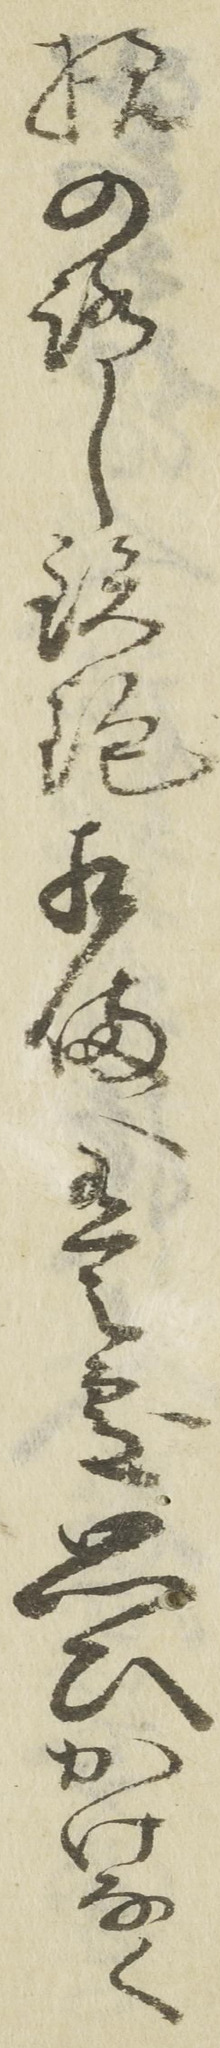様のろし鉄砲相備へ有之処思ひかけなく
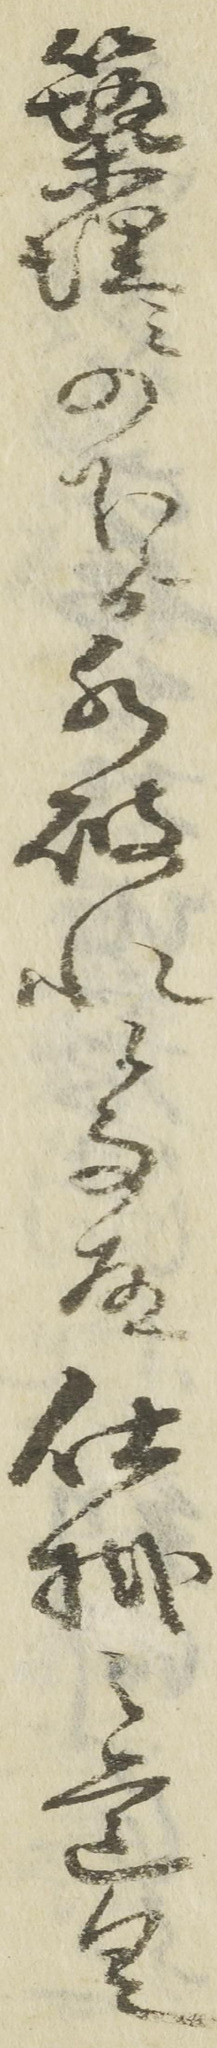築埋ミの下ゟ水破れ候事故仕掛之道具
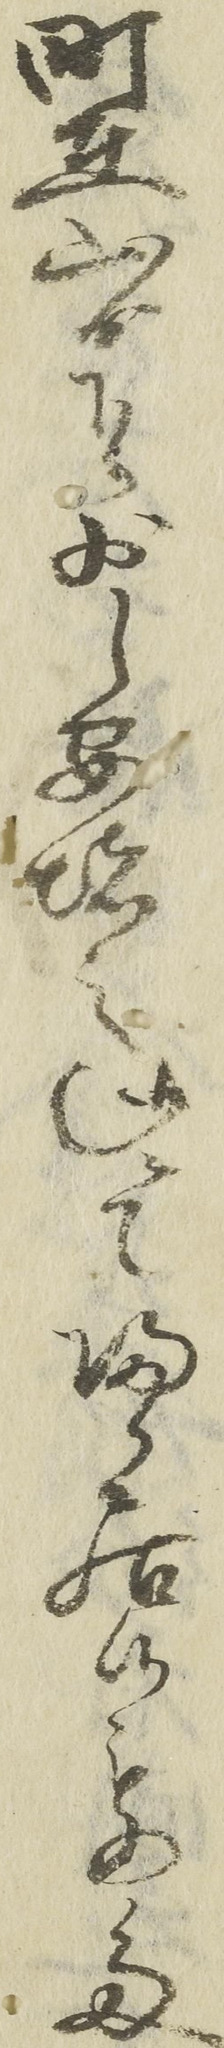町在山ゟ下り少し安堵之趣ニて帰り居候もの多
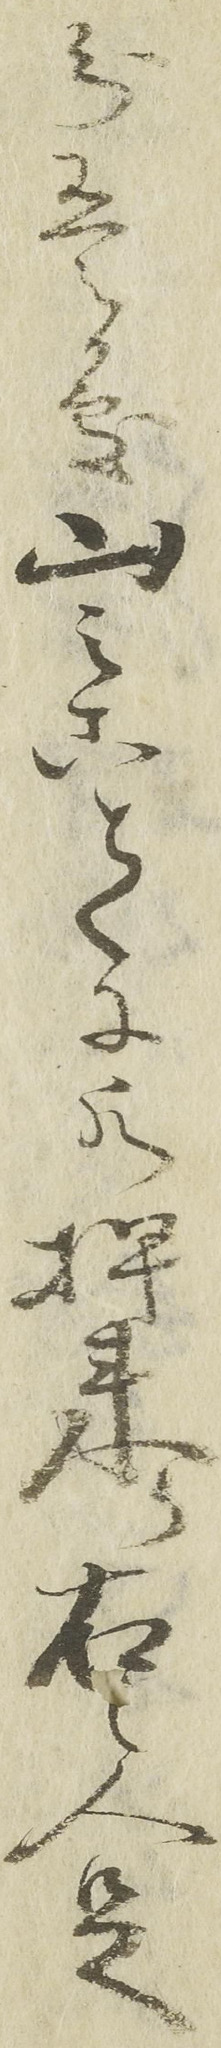分有之候処山之ことくに水押来り右之人足
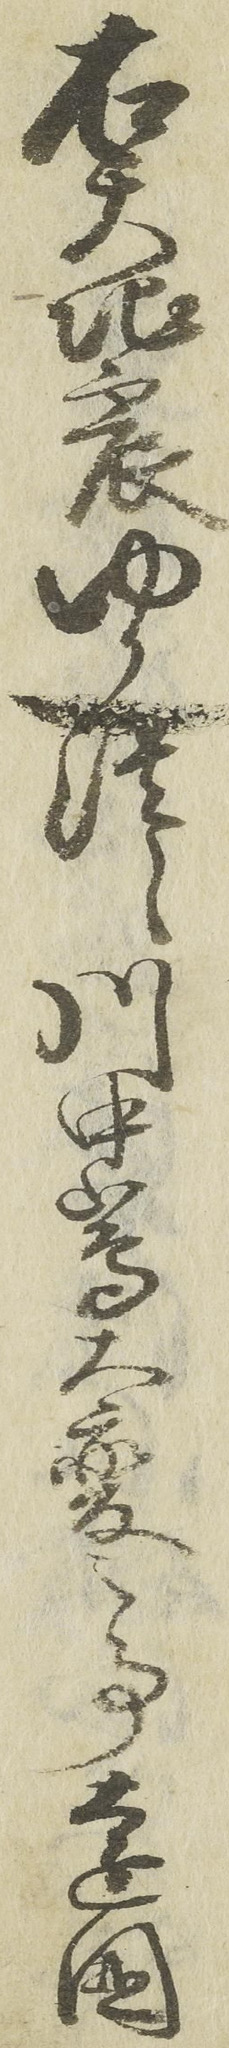右大地震ゆり潰し川中島大変之事遠国
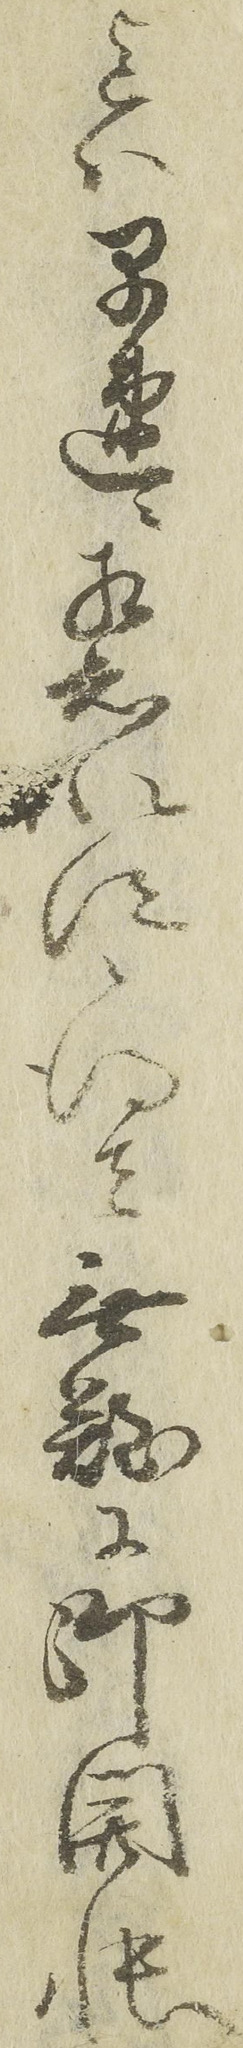迄ハ早速に相知れす候得は無難に御開帳

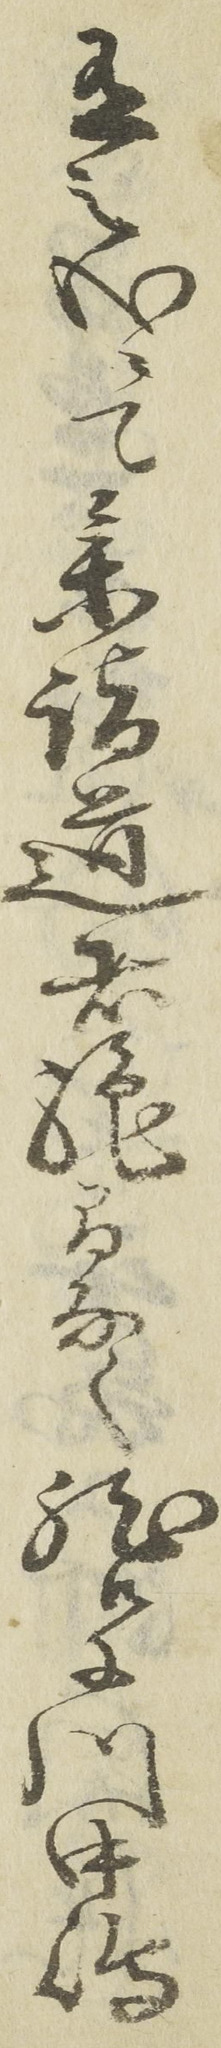有之哉ニて参詣道は絶間なく然ルに川中島
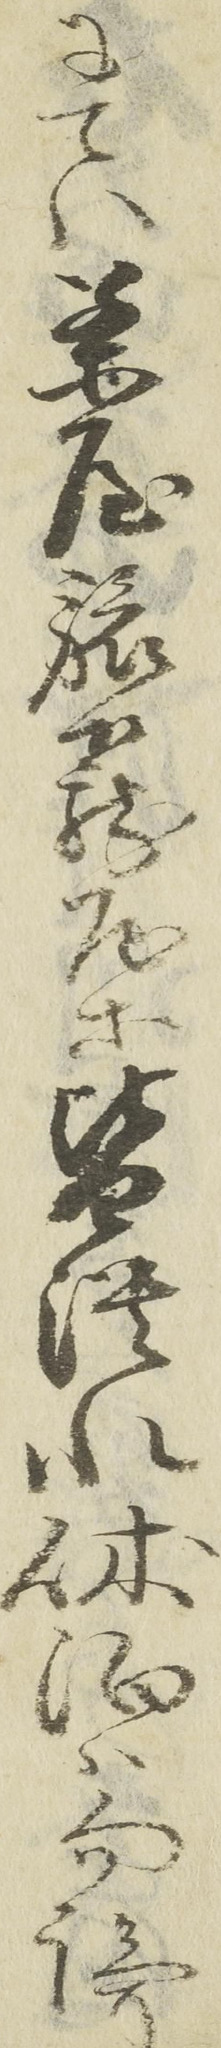にてハ兼屋旅籠屋等皆潰れ休泊ハ勿論
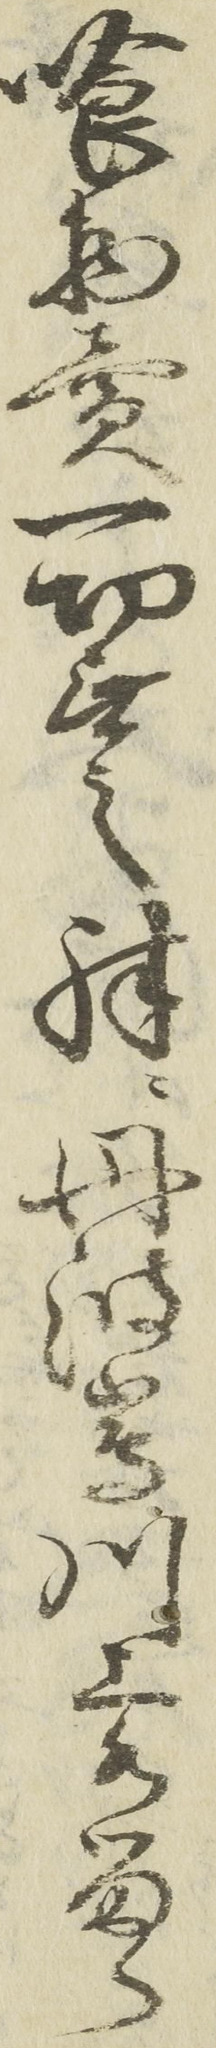喰物売一切無之殊ニ丹波嶋川上水留り
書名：弘化四　大地震由来　全
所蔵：東京大学地震研究所図書室 Earthquake Research Institute Library, The University of Tokyo, JAPAN
